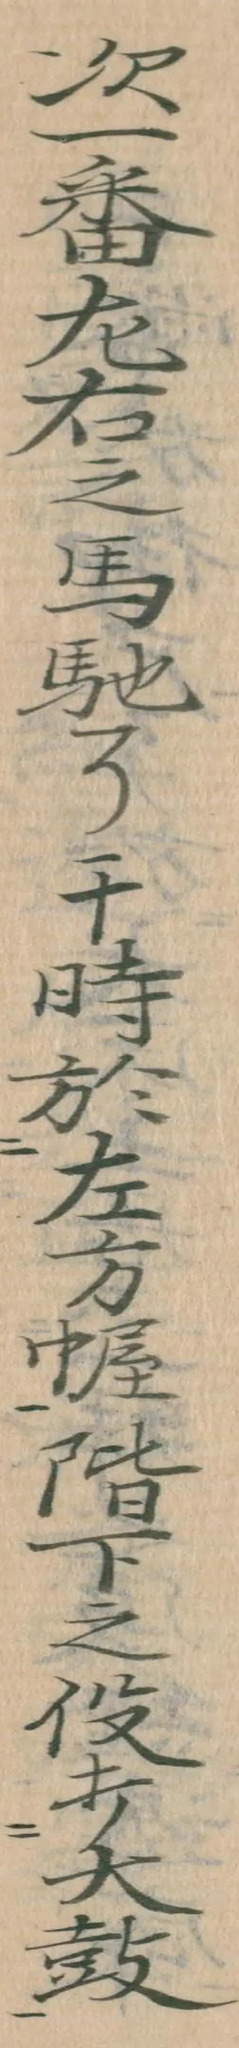次一番左右之馬馳了于時於左方幄階下之役打大鼓

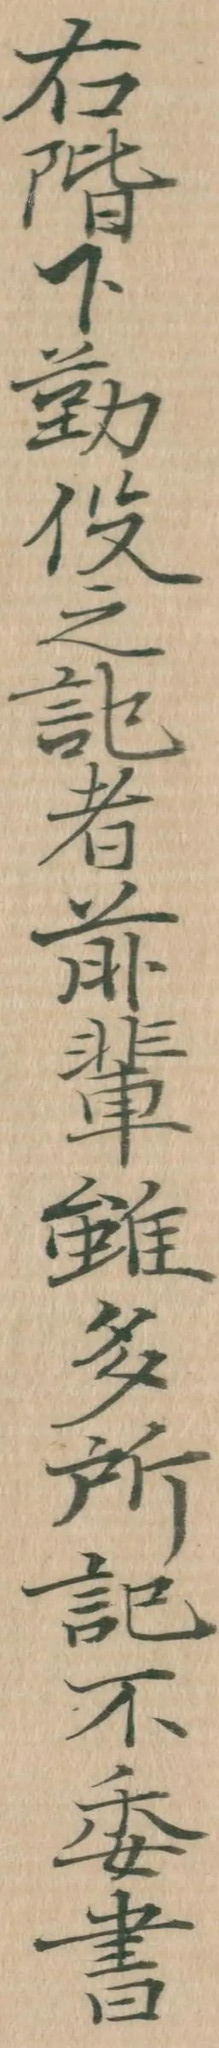右階下勤役之記者前輩雖多所記不委書
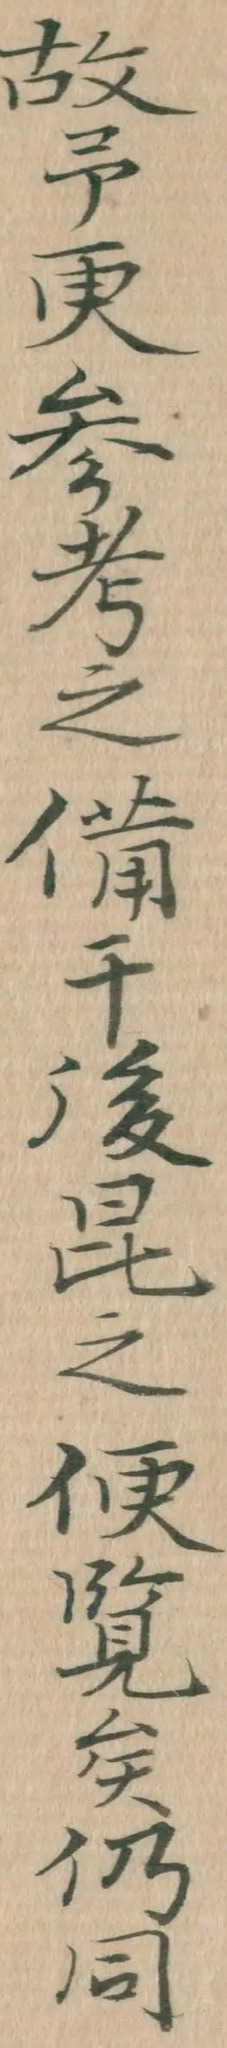故予更参考之備于後昆之便覧矣仍同
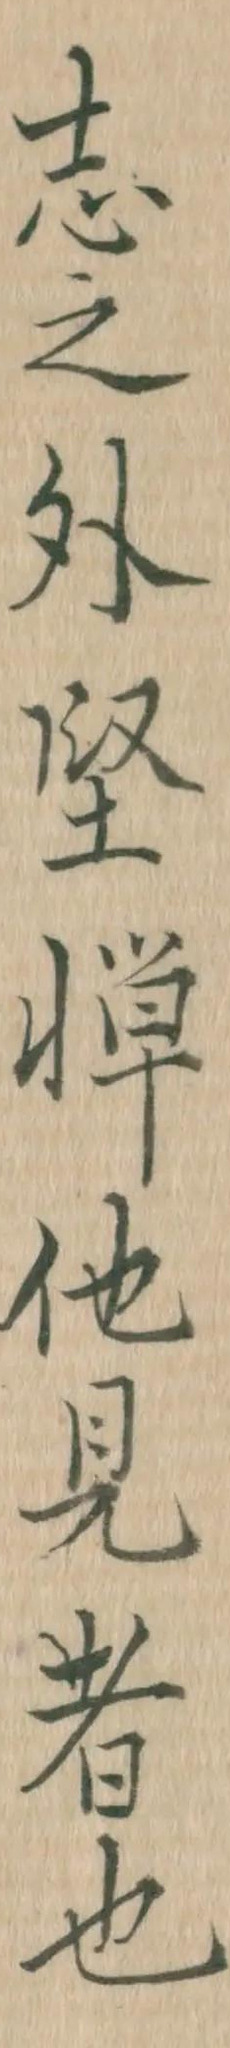志之外堅憚他見者也
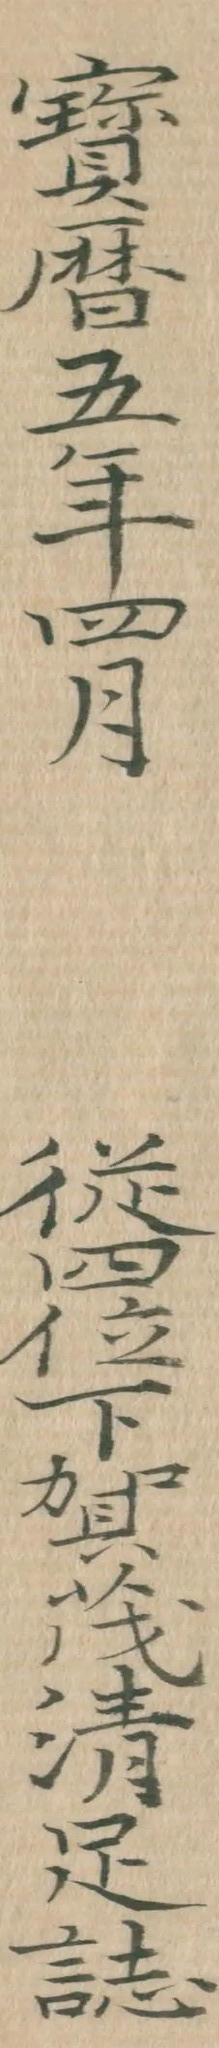宝暦五年四月従四位下賀茂清足誌

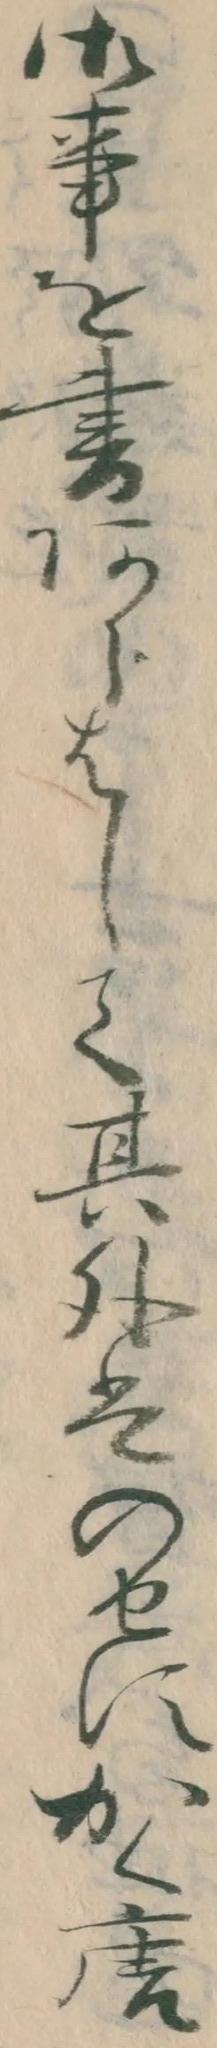御事を書あらはして其外はのせすかく唐
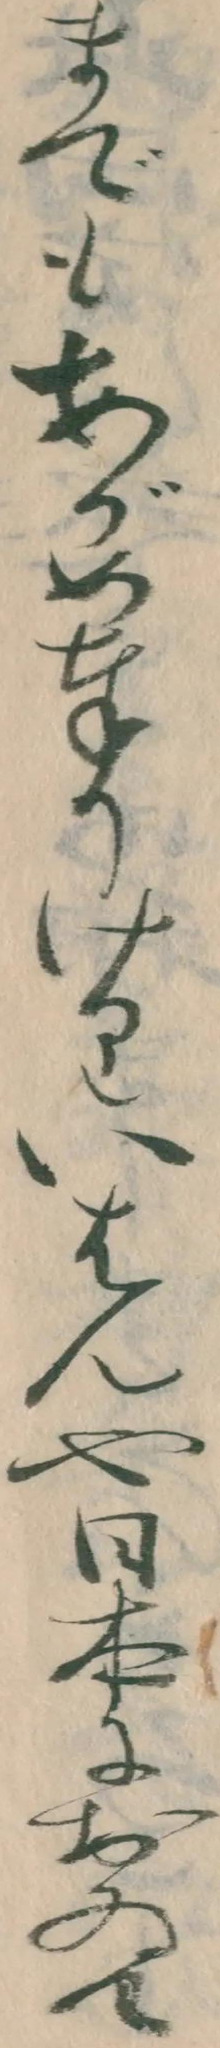までもあがめ奉りけりいはんや日本におゐて
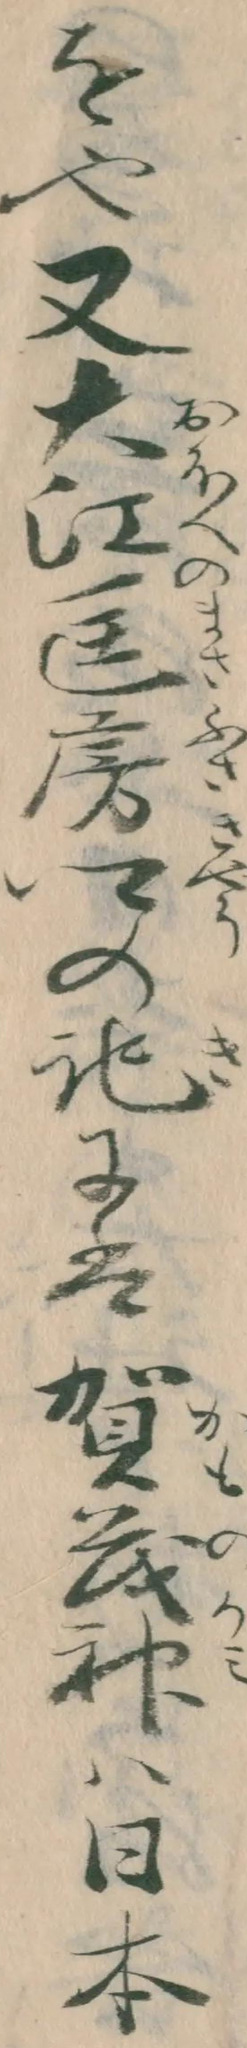をや又大江匡房卿の記には賀茂神は日本
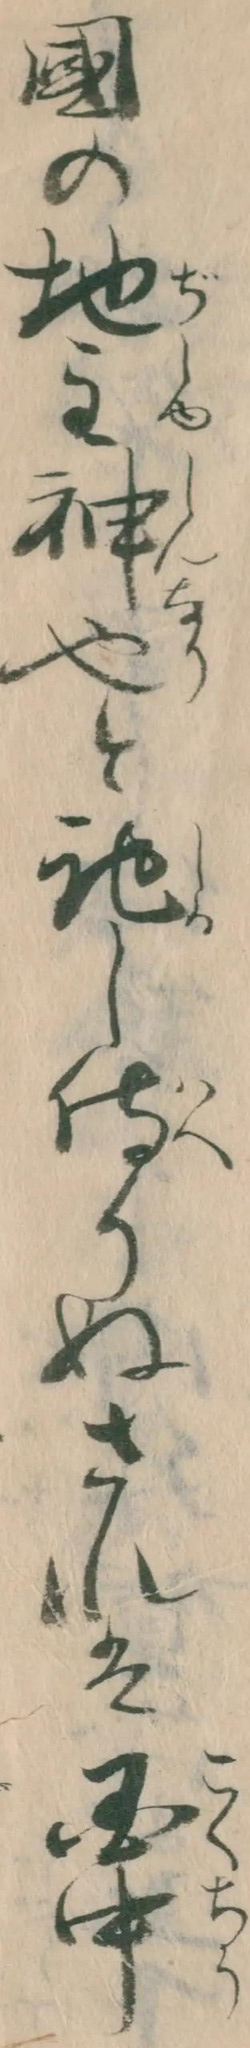国の地主神也と記し侍りぬされは国中
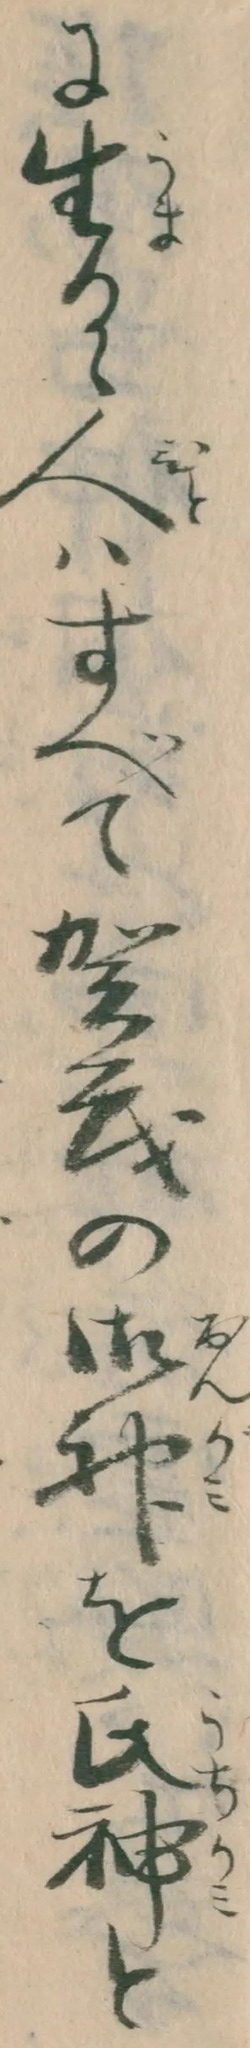に生るゝ人はすべて賀茂の御神を氏神と
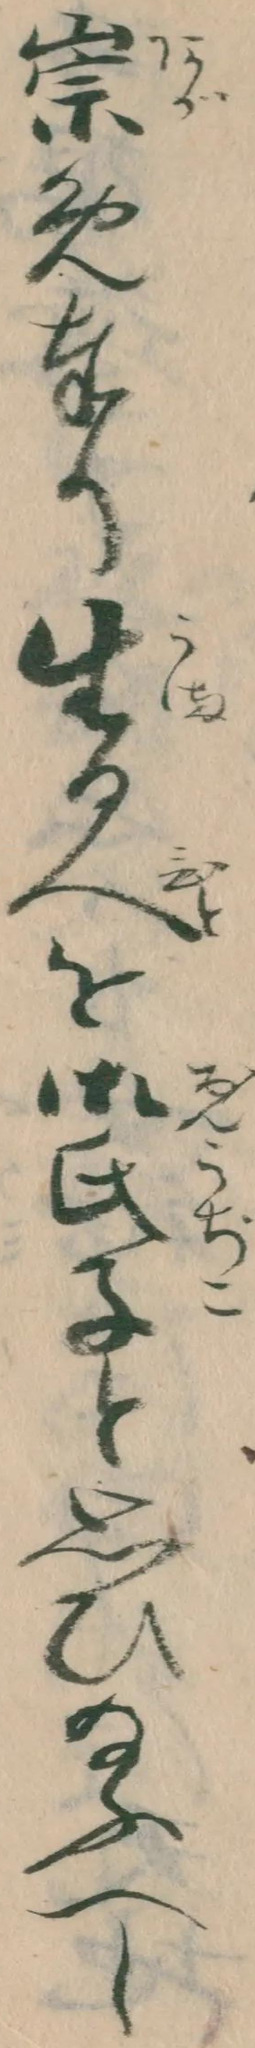崇め奉り生る人を御氏子と思ひ給ふへし
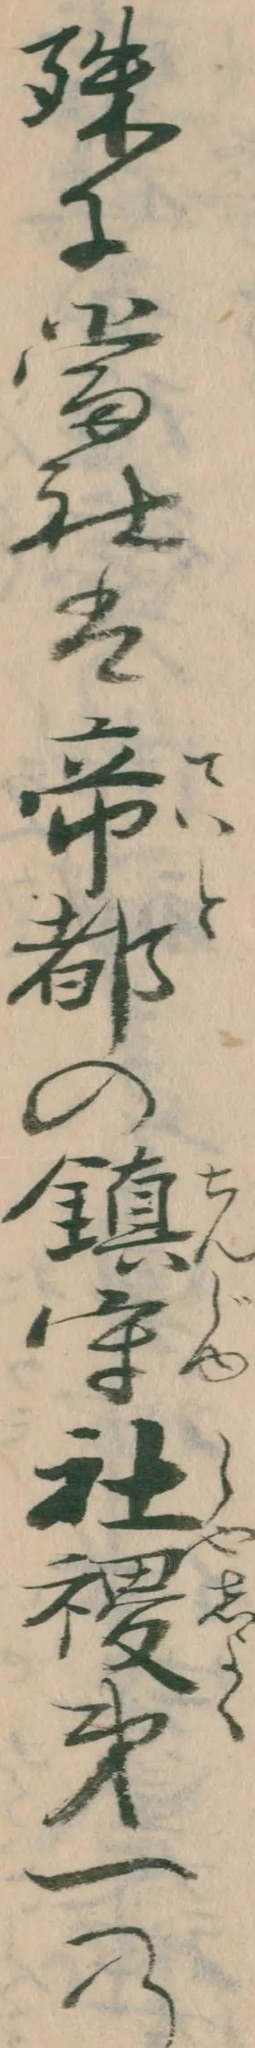殊に当社は帝都の鎮守社禝第一の
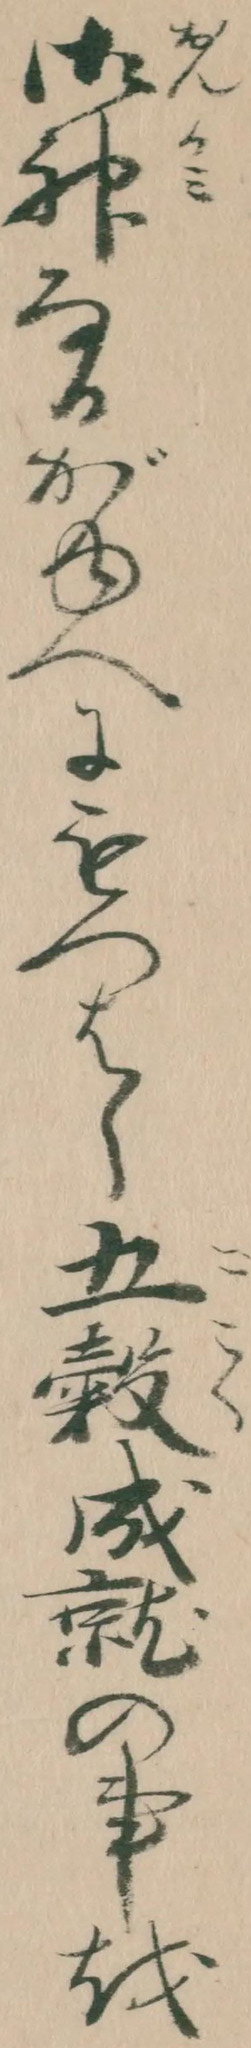御神なるがゆへにもつはく五穀成就の事を
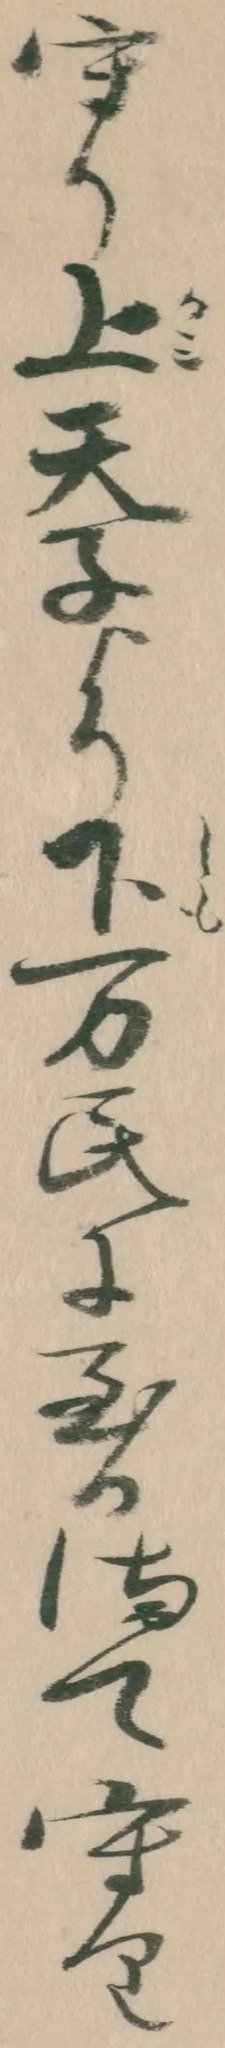守り上天子より下万民に至るまて守り
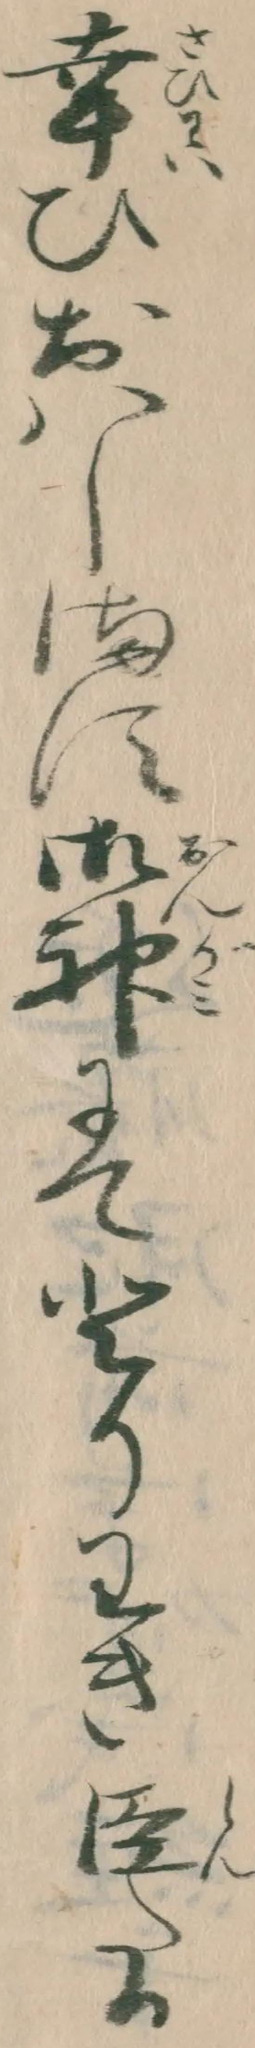幸ひおはします御神にてとりわき臣たる
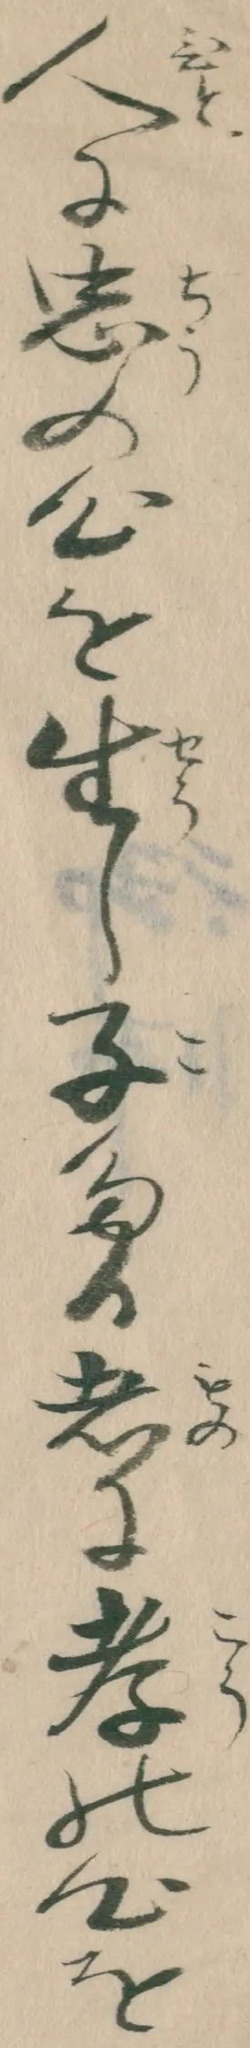人に忠の心を生し子たる者に孝の心を
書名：賀茂社記録. 第8冊
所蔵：国立国会図書館 National Diet Library, JAPAN
